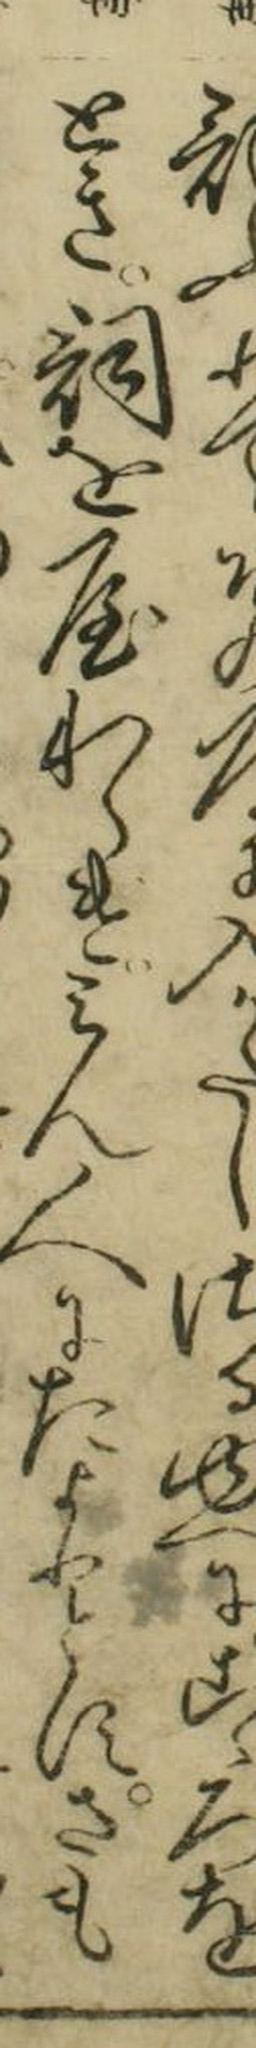とき。詞をやわらき。みん人にたよりとす。さも
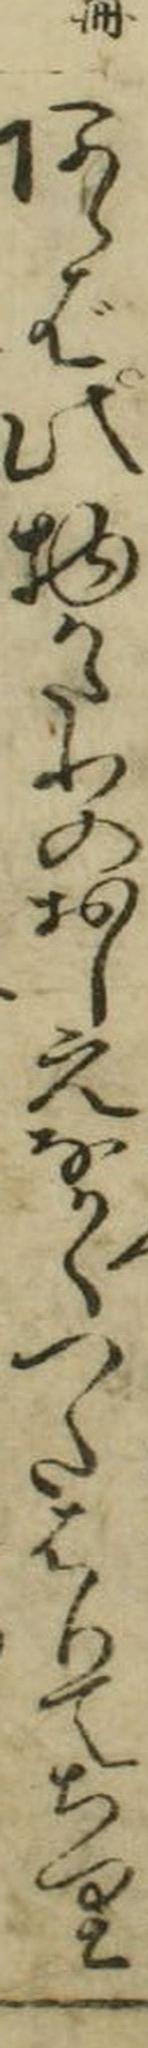あらば。此物かたりのおしえなかくつたはりてちり
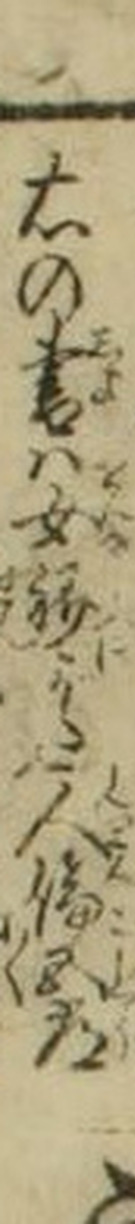右の書は女躾がた人倫五常
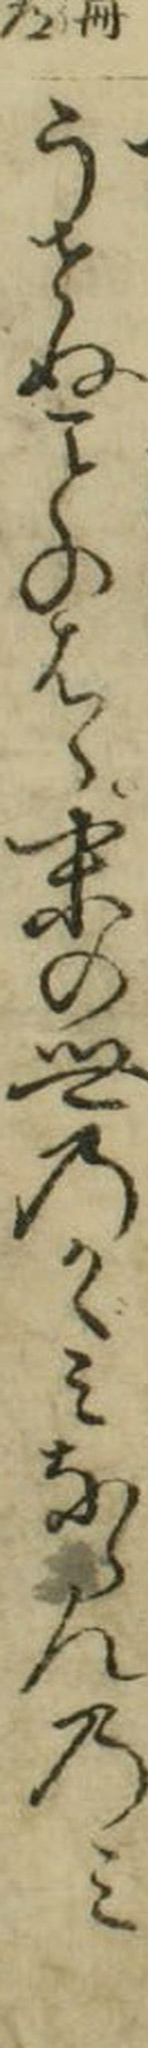うせぬことのはゝ。末の世のかゞみならんのみ
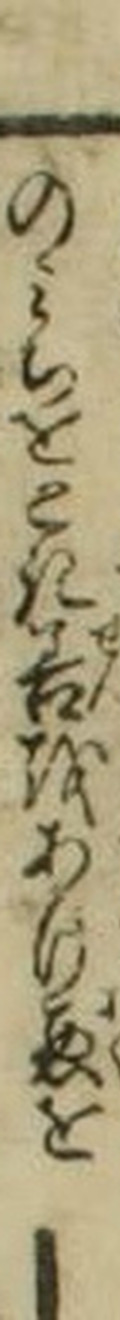のみちをとき善をあけ惡を
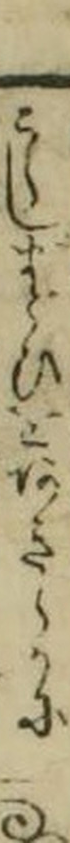こらし。まどひをあきらかに
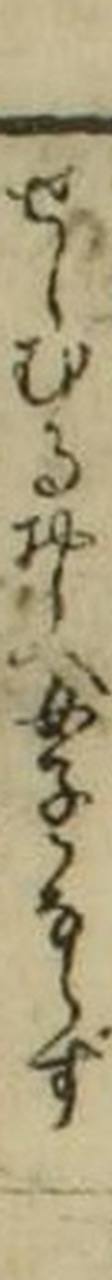せしむるおしへ女子かならず
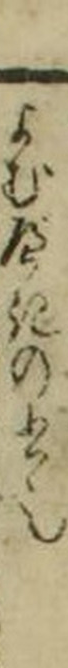よむべきの書也。
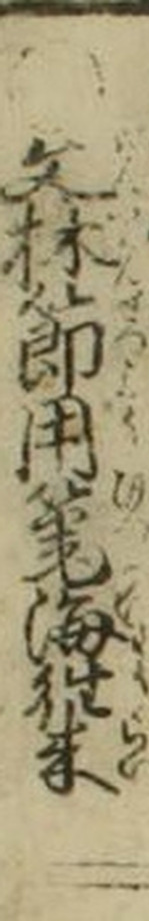○文林節用筆海往来
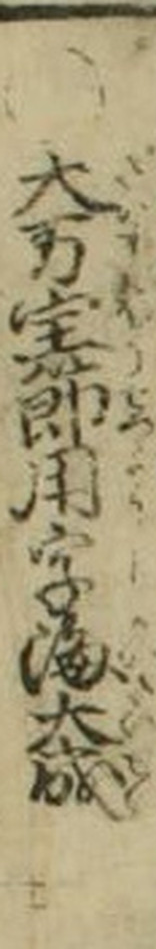○大万宝節用字海大成
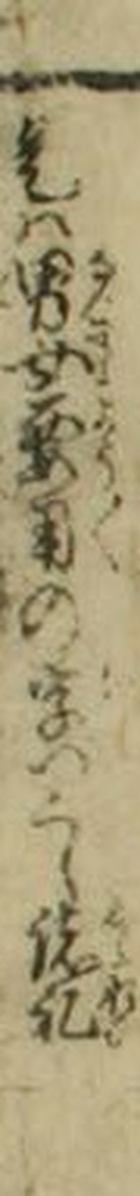是は男女要用の字つくし諸礼
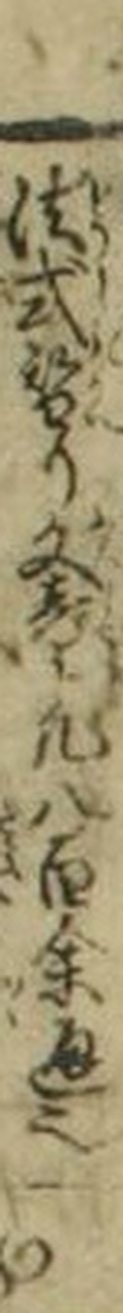法式替り文章凡八百余通也
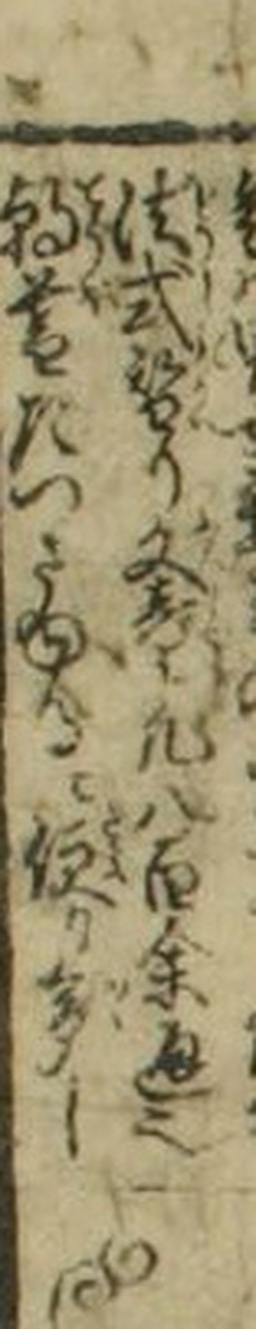朝暮たづさゆるに便り多し
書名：女源氏教訓鑑
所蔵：東京学芸大学附属図書館
